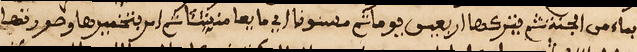بماء من الجنة ثم يتركها اربعين يوما ثم مسنونا اي مايعا منتنا ثم امر بتخميرها وصورتها
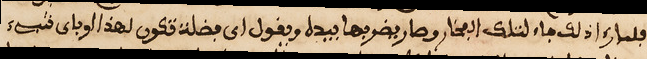فلما رءا ذلك جاء لتلك الفخار وصار يضربها بيده ويقول اى فضلة تكون لهذا او باى شىء
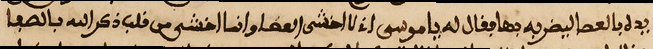يده بالعصا ليضربه بها فقال له يا موسى انى لا اخشى العصا وانما اخشى من قلب ذكر الله بالصفا
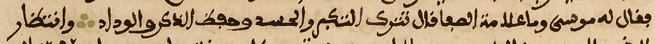فقال له موسى وما علامة الصفا قال تترك التكبر والحسد وحفظ الذكر والوداد وانتظار
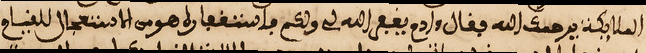الملائكة يرحمك الله فقال ءادم يغفر الله لى ولكم فاستغفاره هو من الاستعجال للقيام
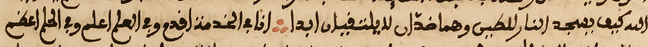الله كيف يسجد النار للطين وهما ضدّان لا يلتقيان ابدا انا في الخدمة اقدم وفي العلم اعلم وفي الحلم اعظم
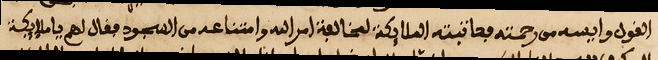القول وايسه من رحمته فحاتبته الملائكة لمخالفة امر الله وامتناعه من السجود فقال لهم يا ملائكة
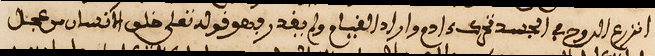انزرع الروح في الجسد تحرك ءادم واراد القيام ولم يقدر فهو قوله تعلى خلق الانسان من عجل
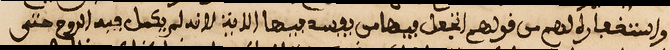واستغفاره لهم من قولهم اتجعل فيها من يفسد فيها الاية لانه لم يكمل فيه الروح حتى
